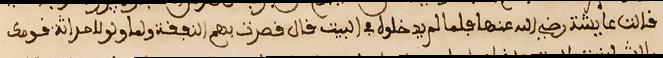قالت عايشة رضي الله عنها فلما لم يدخلوه في البيت قال قصرت بهم النفقة ولما ولو لا حداثة قومك
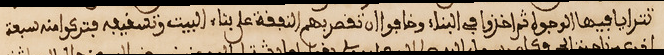تترايا فيها الوجوه ثم اخذوا في البناء وخافوا ان تقصر بهم النفقة على بناء البيت وتسقيفه فتركوا منه سبعة
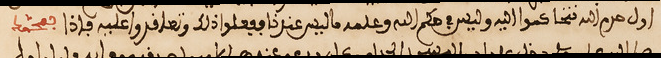اول حرم الله نتحا كموا اليه وليس في حكم الله وعلمه ما ليس عندنا ففعلوا ذلك وتعاقدوا عليه فاذا بمحمد
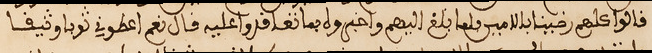قالوا كلهم رضينا بالامين فلما بلغ اليهم واخبروه بما تعاقدوا عليه قال نعم اعطوني ثوبا وثيقا
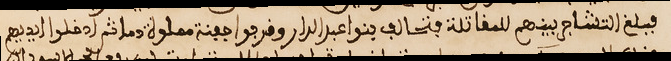فبلغ التشاجر بينهم للمقاتلة فتحالف بنوا عبد الدار وقربوا جفنة مملوة دما ثم ادخلوا ايديهم
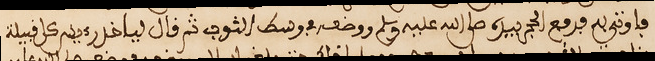فاوتي به فرفع الحجر بيده صلى الله عليه وسلم ووضعه في وسط الثوب ثم قال لياخد رءيس كل قبيلة
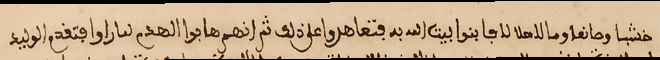خشبا وصانعا ومالا حلالا فابنوا بيت الله به فتعاهدوا على ذلك ثم انهم هابوا الهدم لما راوا فتقدم الوليد
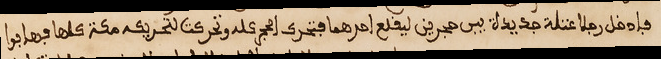فادخل رجلا عتلة جديدة بين حجرين ليقلع احدهما فتحرك الحجر كله وتحركت لتحريكه مكة كلها فهابوا
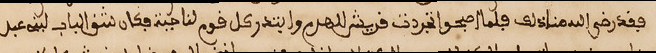فقد رضى الله منا ذلك فلما اصبحوا تجردت قريش للهدم وابتدر كل قوم لناحية فكان شق الباب لبنى عبد
